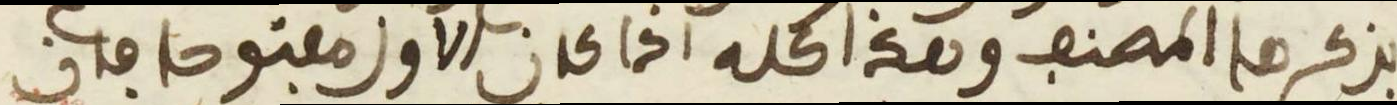يذكرها المصنف و هذا كله اذا كان الاول مفتوحا فان
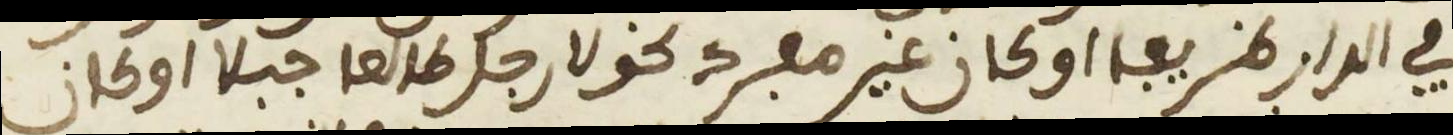في الدار ظريفا او كان غير مفرد نحو لا رجل طالعا جبلا او كان
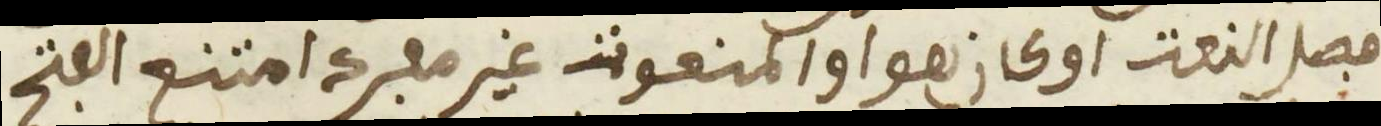فصلت النعت او كان هو او المنعوت غير مفرد امتنع الفتح
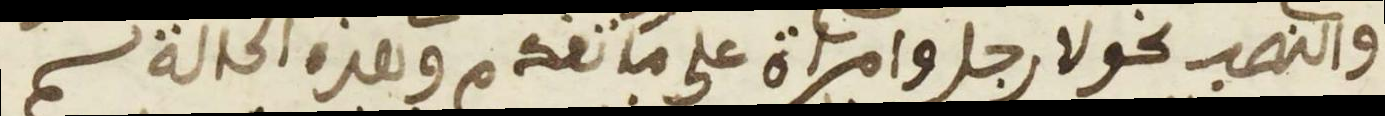والنصب نحو لا رجل وامراة على ما تقدم وهذه الحالة لم
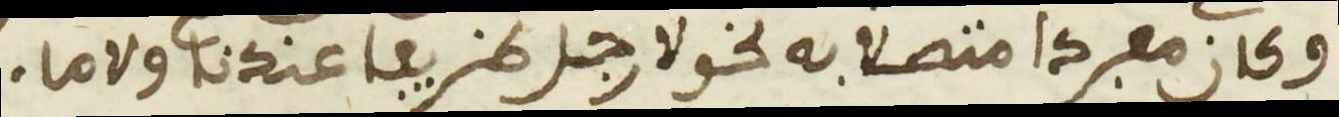وكان مفردا متصلا به نحو لا رجل ظريفا عندنا ولا ماء
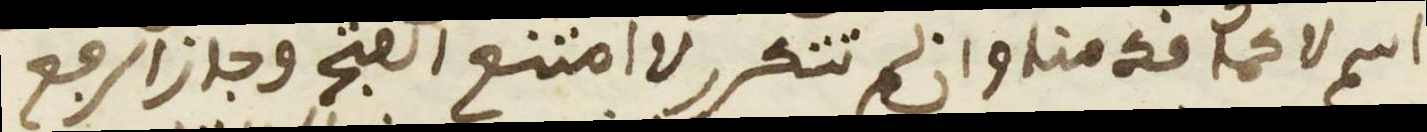اسم لا كما قدمنا وان لم تتكررلا امتنع الفتح وجاز الرفع
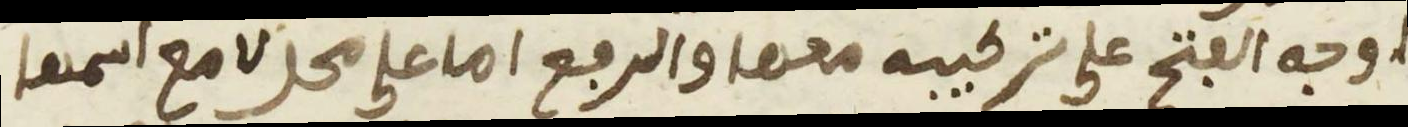اوجه الفتح على تركيبه معها والرفع اما على محل لا مع اسمها
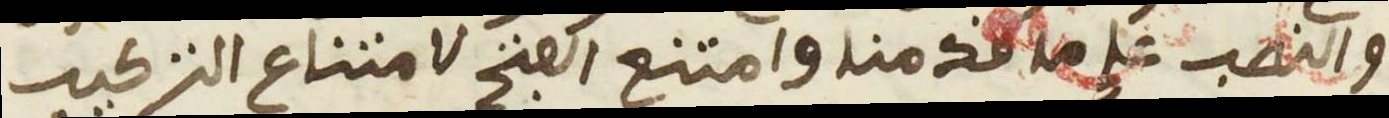والنصب على ماقدمنا وامتنع الفتح لامتناع التركيب
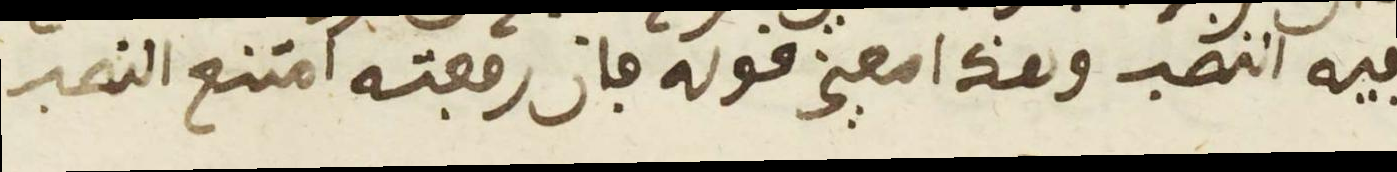فيه النصب وهذا معني قوله فان رفعته امتنع النصب
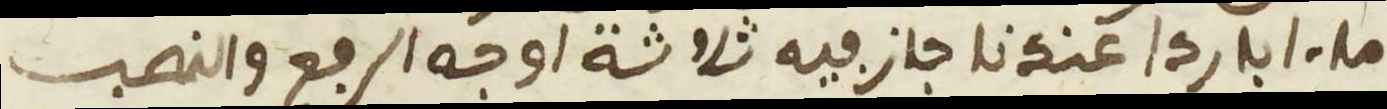ماءا باردا عندنا جاز فيه ثلاثة اوجه الرفع والنصب
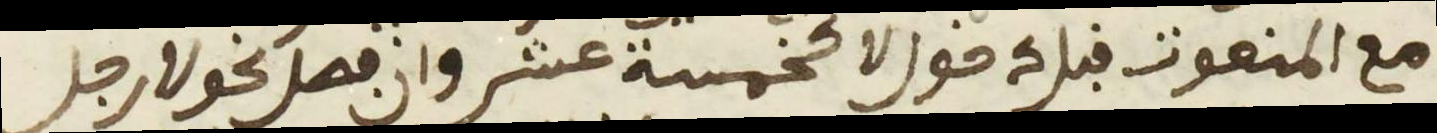مع المنعوت قبل دخول لا كخمسة عشر و ان فصل نحو لا رجل
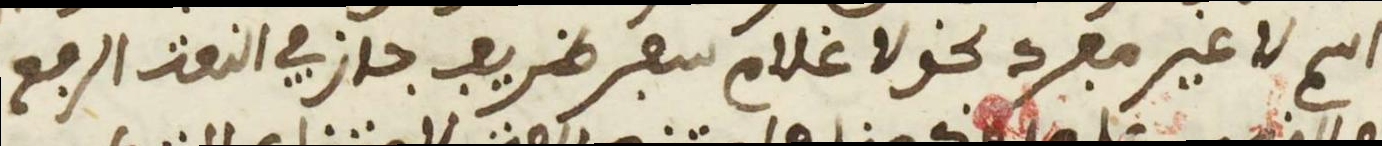اسم لا غير مفرد نحو لا غلام سفر ظريف جاز في النعت الرفع
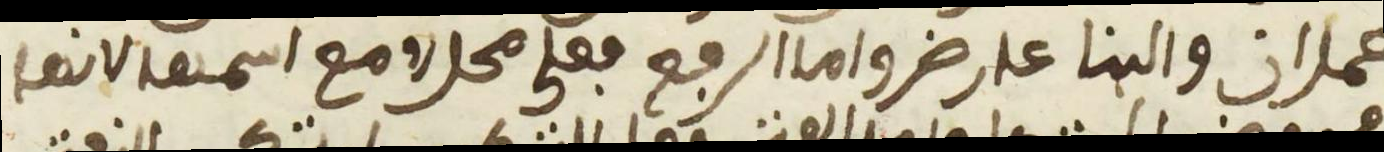عملان والبنا عارض واما الرفع فعلى محل لا مع اسمها لانها
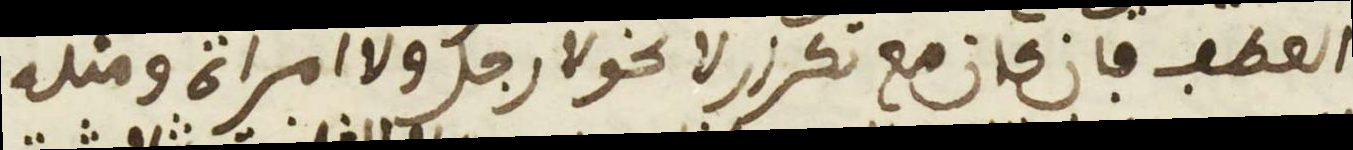العطف فان كان مع تكرار لا نحو لا رجل ولا امراة و مثله
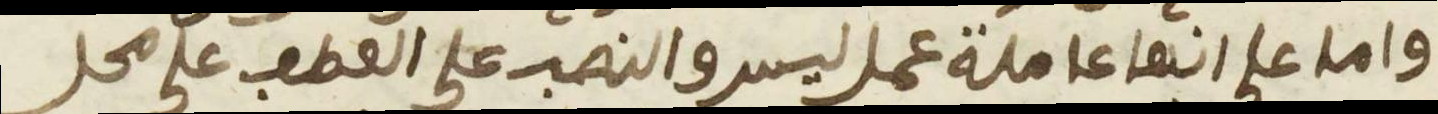واما على انها عاملة عمل ليس والنصب على العطف على محل
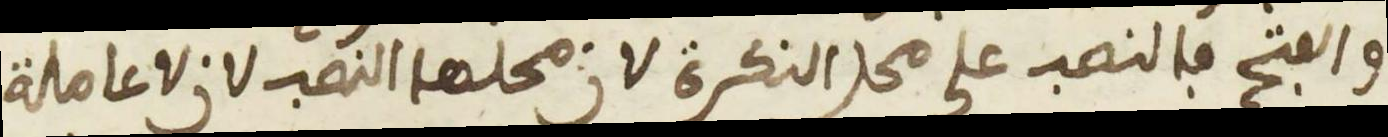والفتح فالنصب على محل النكرة لان محلها النصب لان لاعاملة
